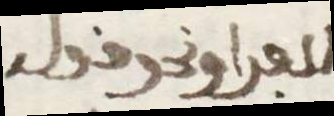للفدا ونحو قوله
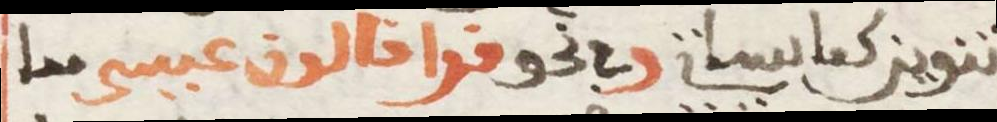تنوين كما سياتي وفي نحو ندا قالون عيسى مما
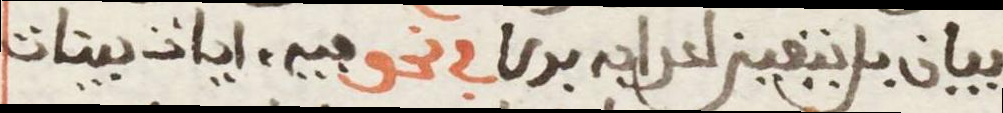بيان بل يتعين اعرابه بدلا في نحو فيه ءايات بينات
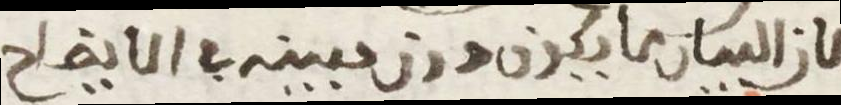لان البيان لا يكون دون مبينة في الايضاح
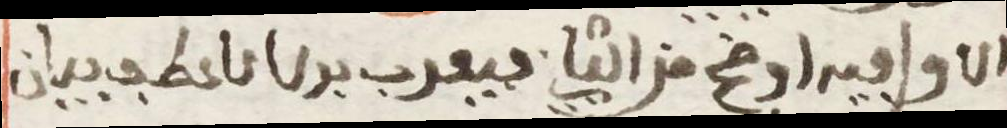الاول فيه اوضح من الثاني فيعرب بدلا لا عطف بيان
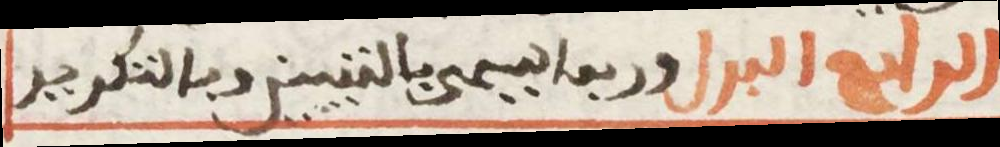الرابع البدل وربما يسمى بالتبيين وبالتكرير
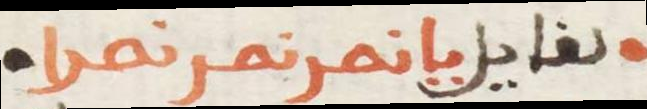لقايل يا نصر نصر نصرا
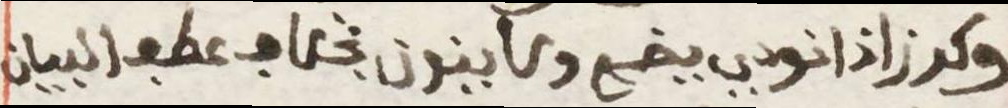وكرز اذا نودي يضم ولا ينون بخلاف عطف البيان
